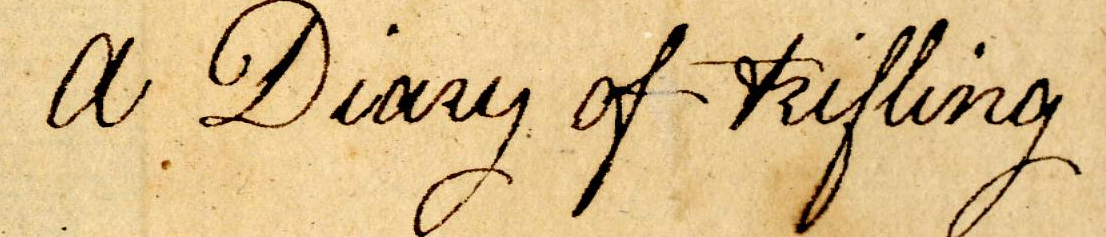A Diary of trifling
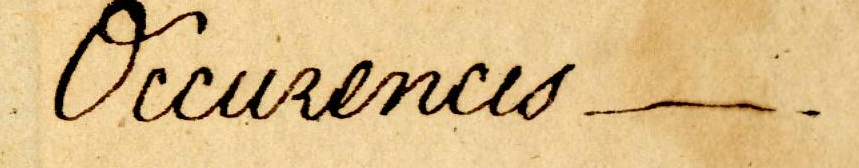Occurences-
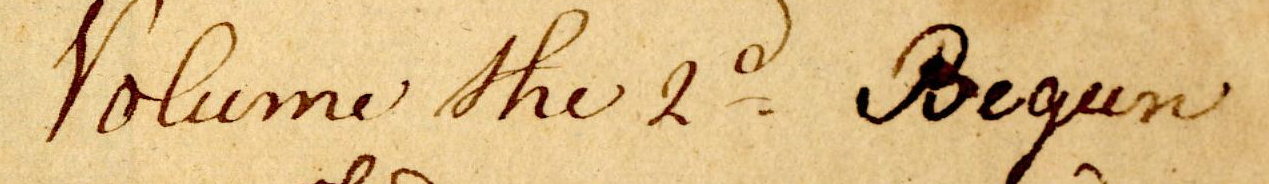Volume the 2^d Begun
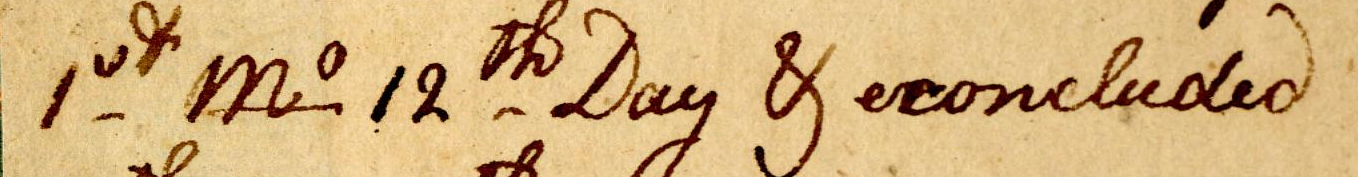1^st M^o 12^th Day & econcluded
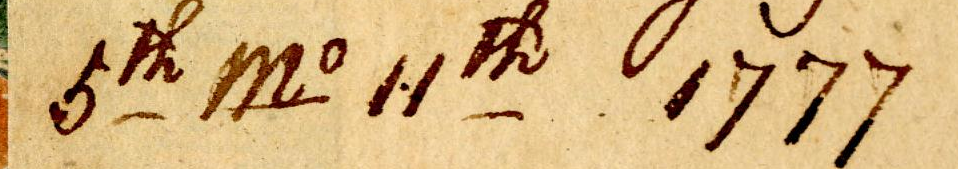5^th M^o 11^th 1777
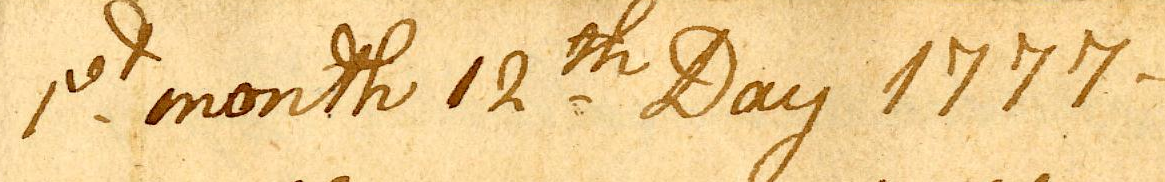1^st. month 12^th Day 1777
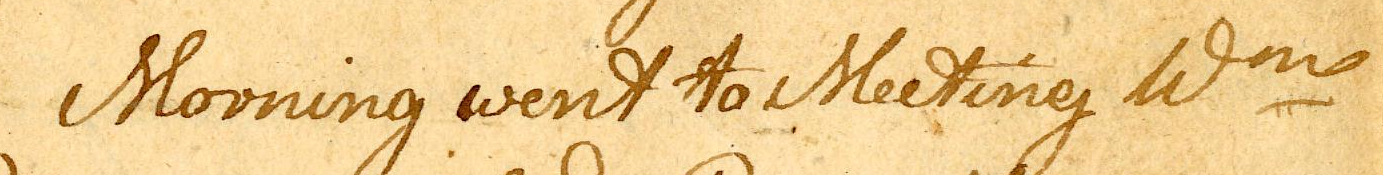Morning went to Meeting W^m
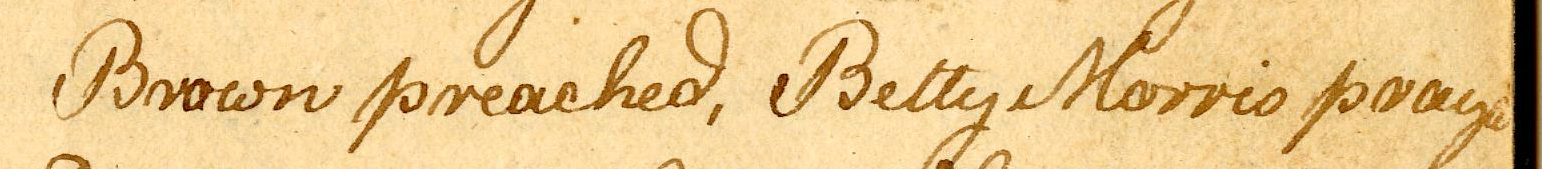Brown preached, Betty Morris prays
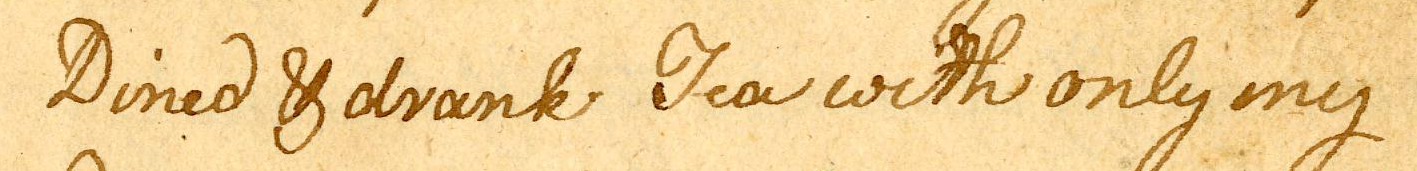Dined & drank Tea with only my
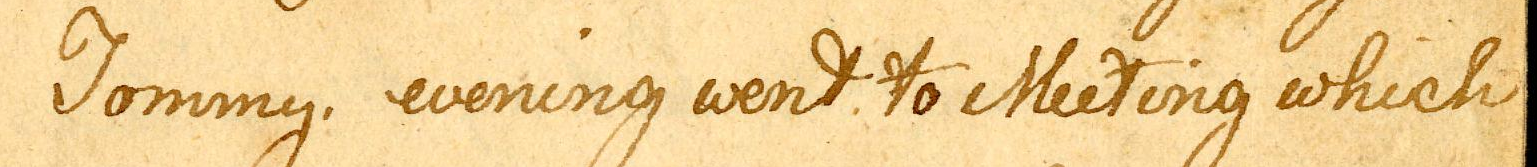Tommy. evening went to Meeting which
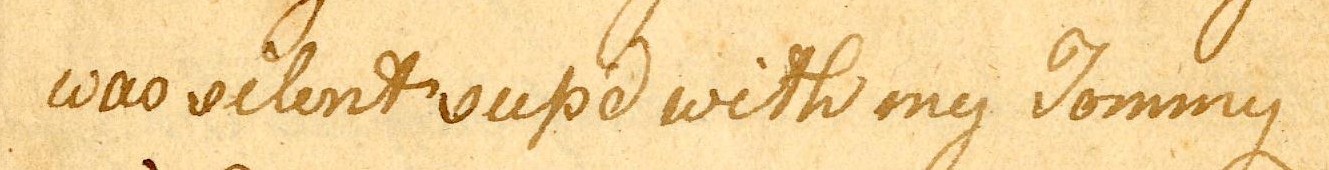was silent sup'd with my Tommy
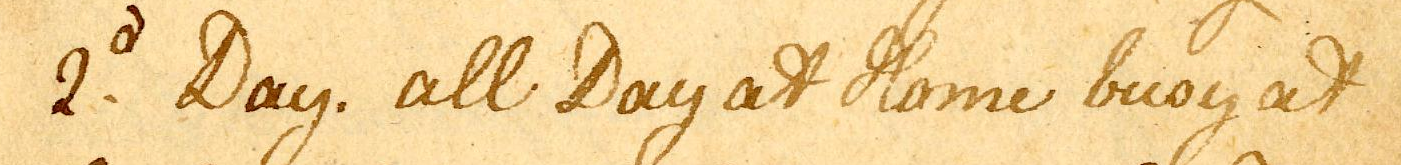2^d Day. all Day at Home busy at
